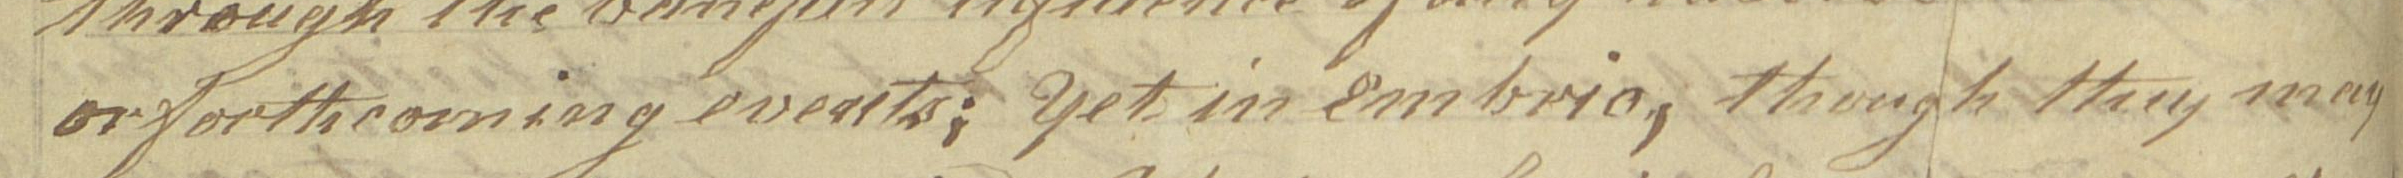or forthcoming events; Yet in embrio, though they may
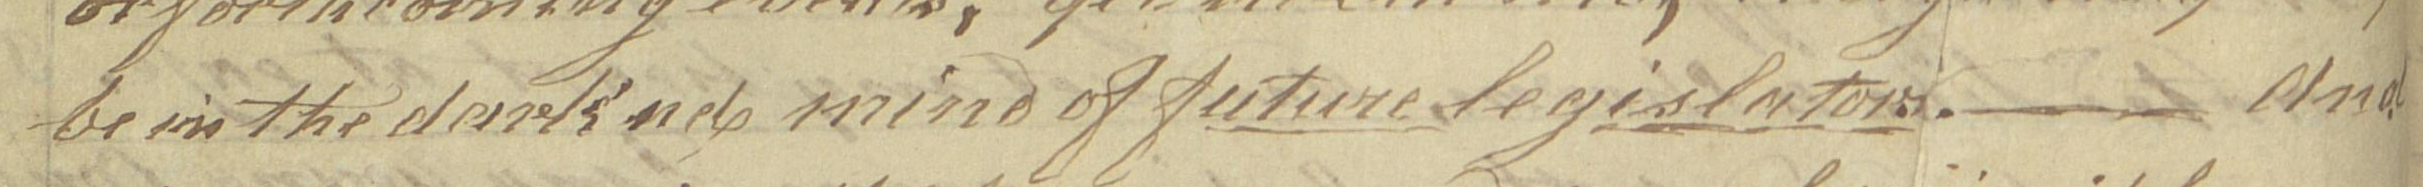be in the darknd mind of future legislators. And
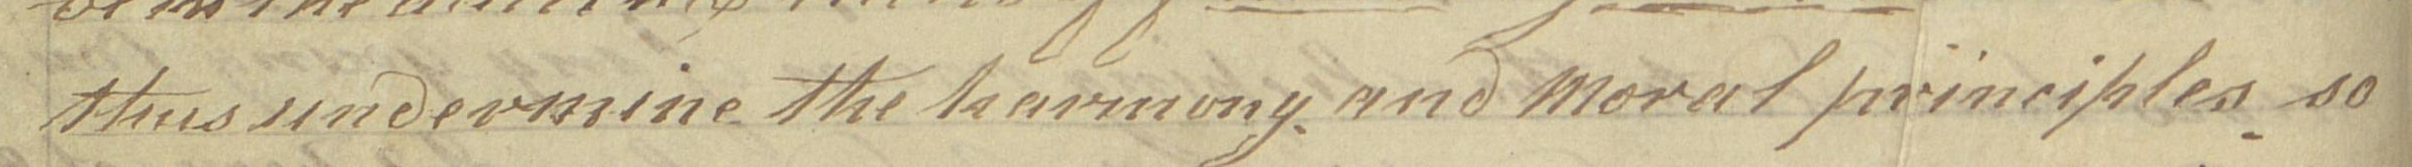thus undermine the harmony and Moral principles so
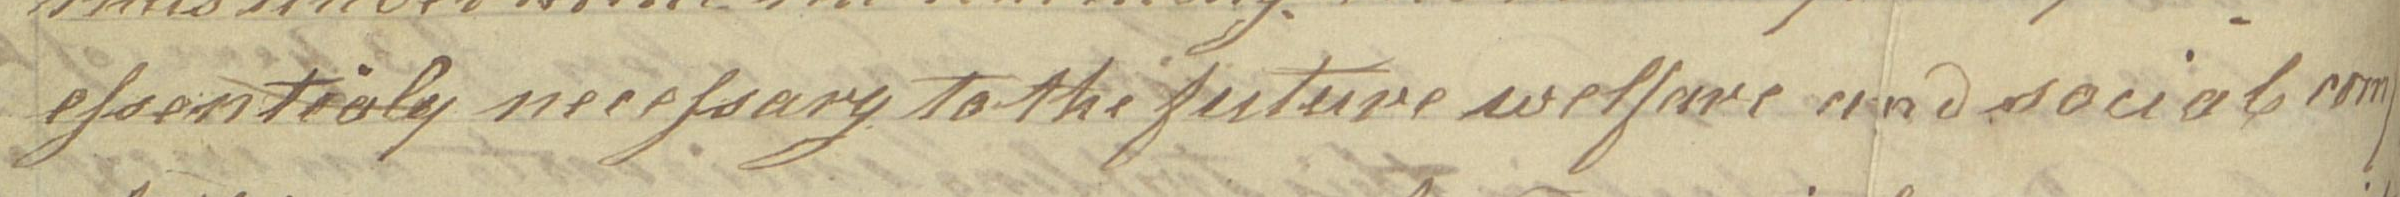essentialy necessary to the future welfare and social comp-
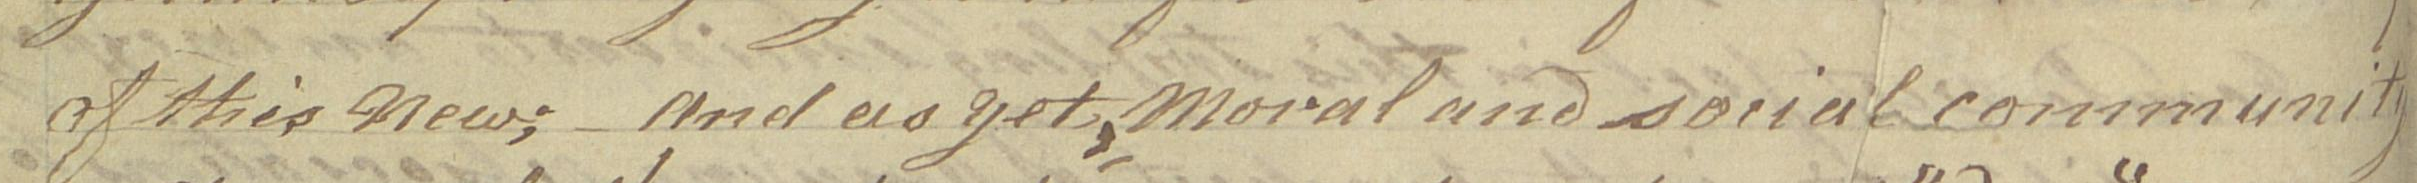of this New; and as yet, Moral and serial community
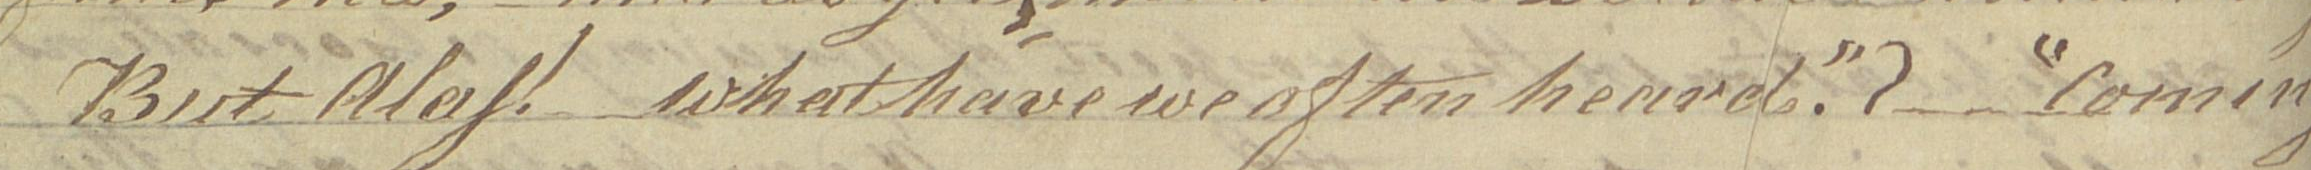But Alas! what have we often heard."? "Coming
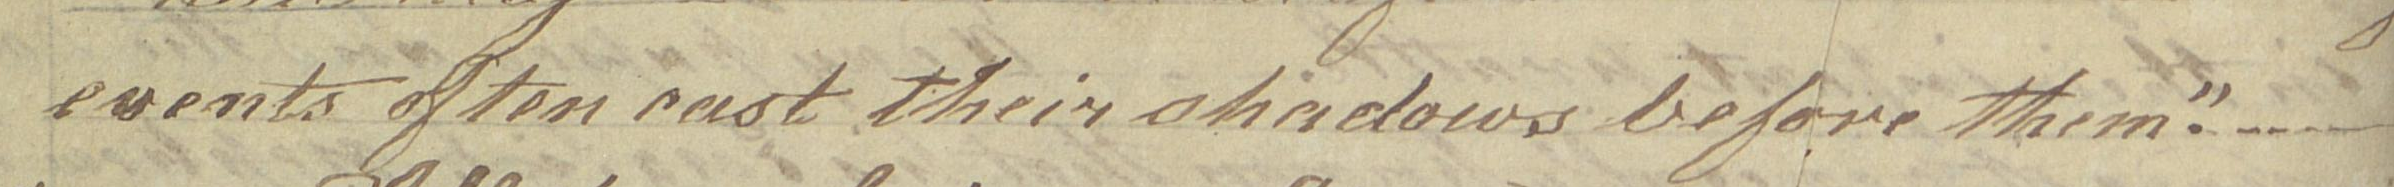events often cast their shadows before them."
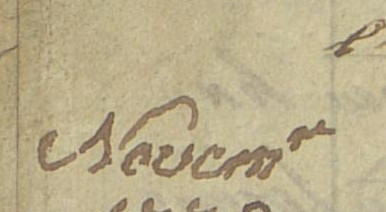Novem^r
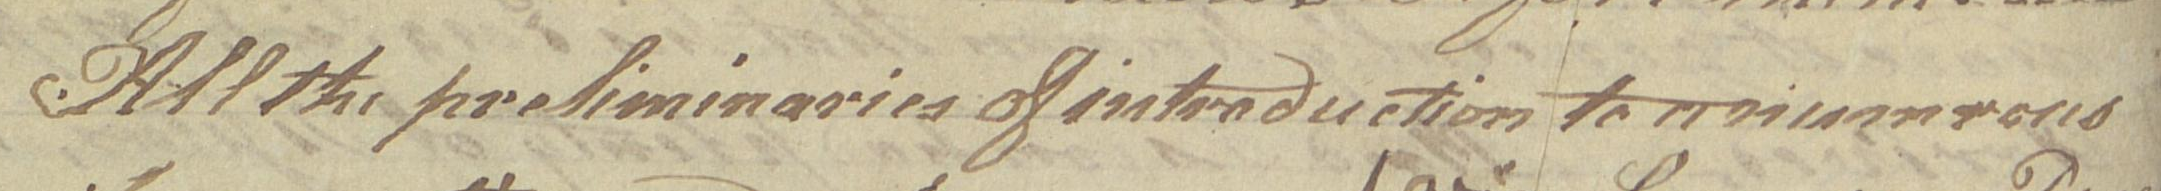All the preliminaries of introduction to a numerous
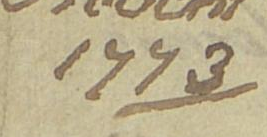1773
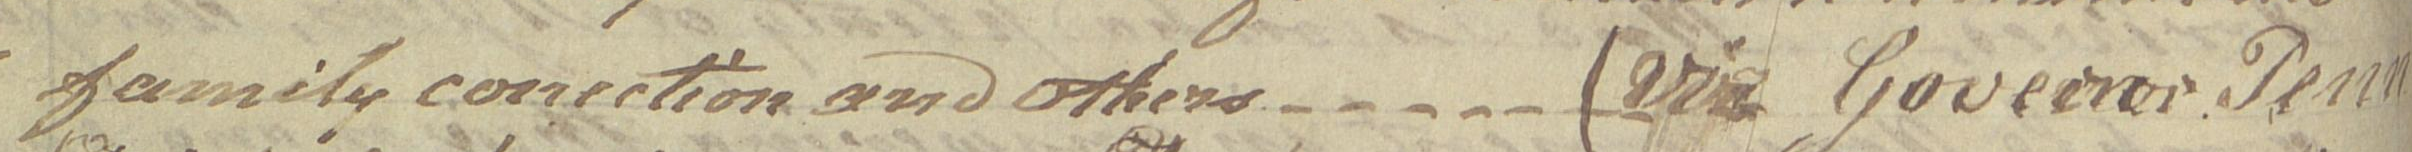family conection and others----- (viz Governor Penn
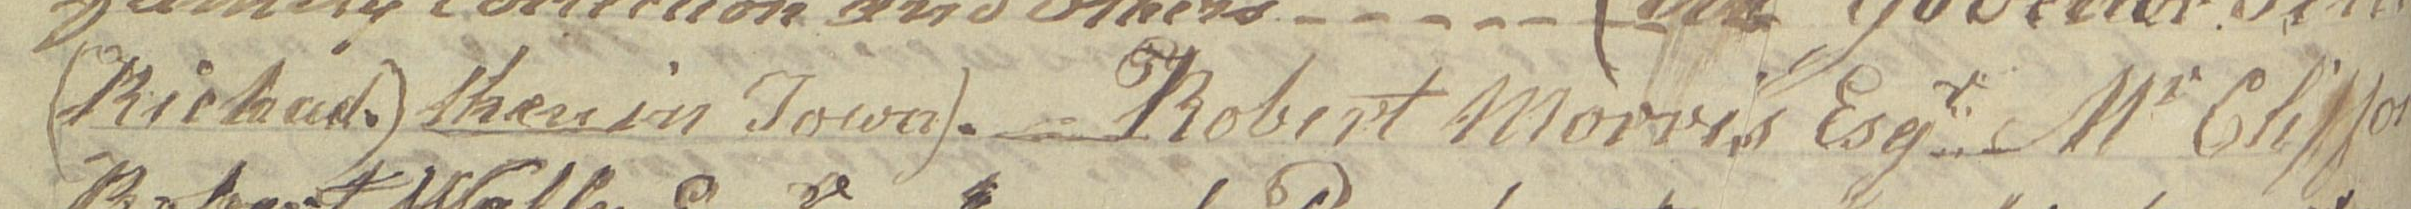(Richad) there in Town). Robert Morris Esq^r. M^r Clifford
